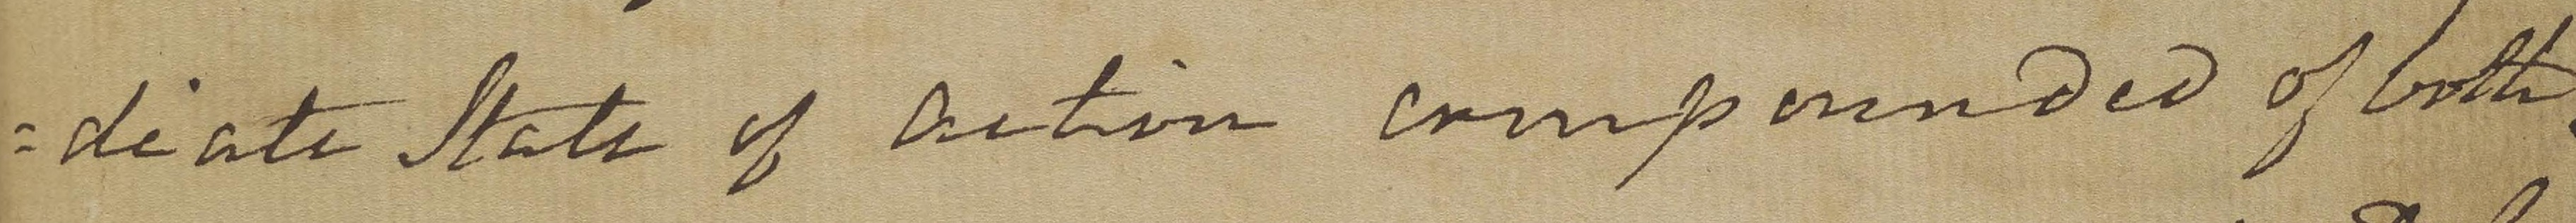-diate state of action compounded of both.
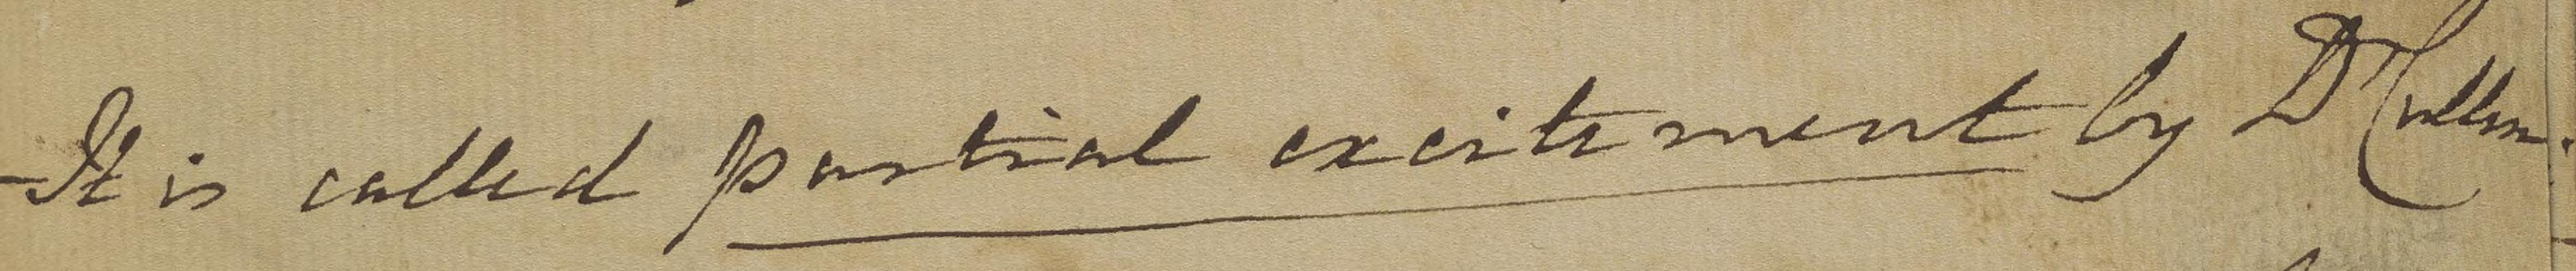It is called partial excitement by D^r Cullen
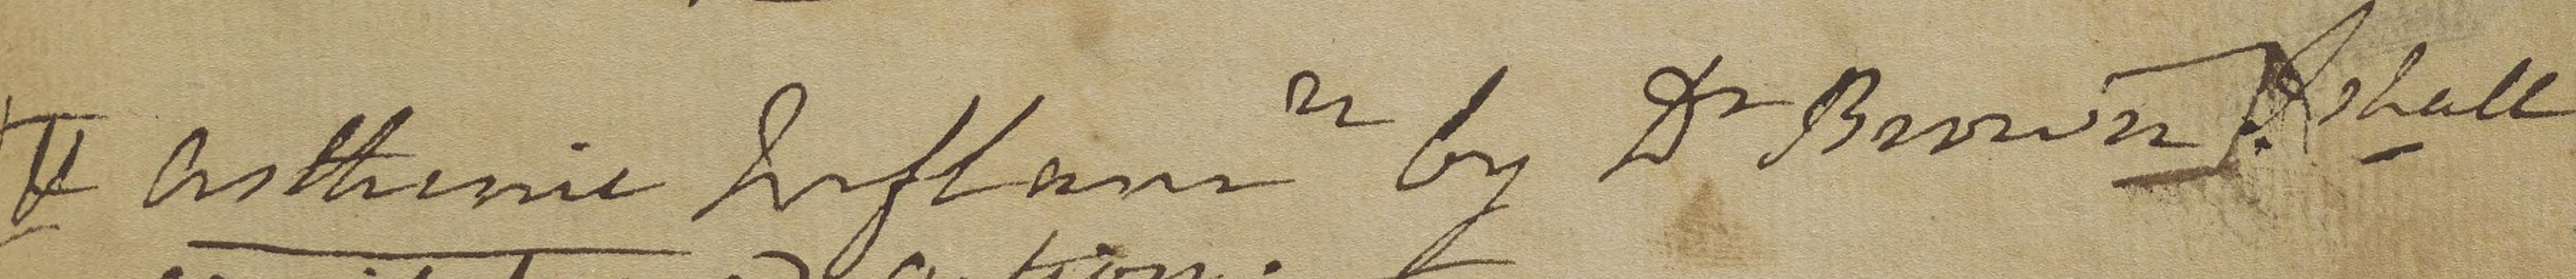II Asthenic System by D^r Brown I shall
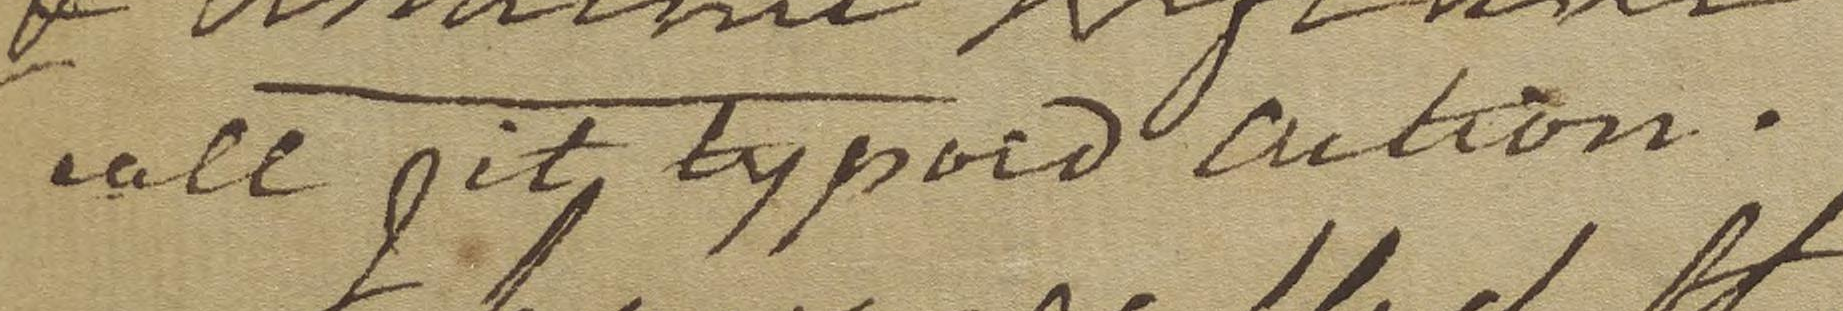call it by said action
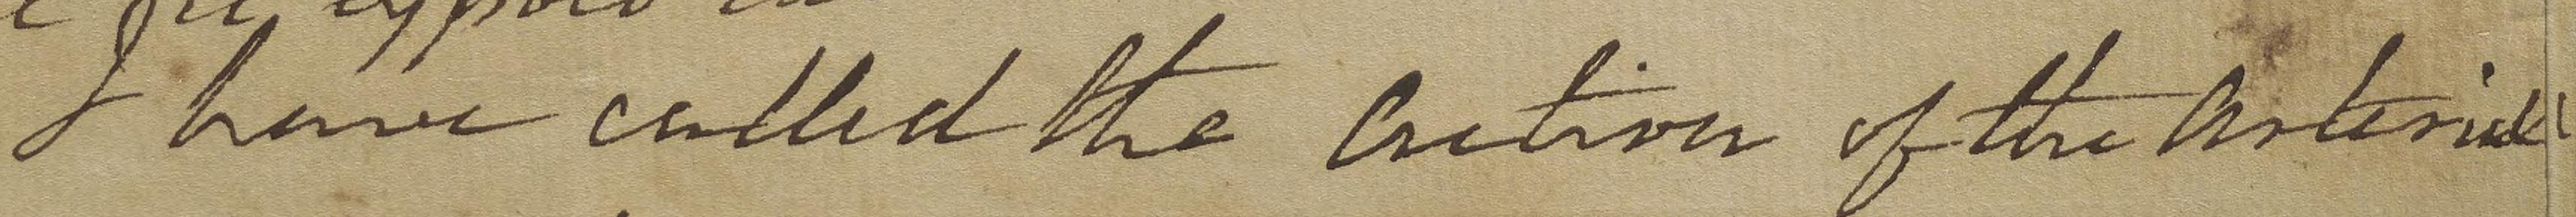I have called the action of the aterial
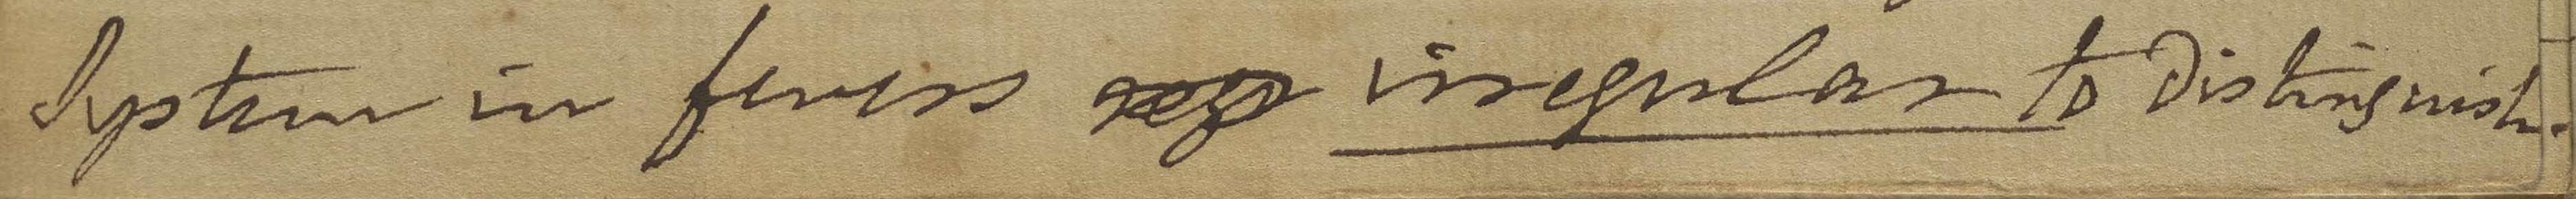system in fevers [reg] irregular to distinguish
